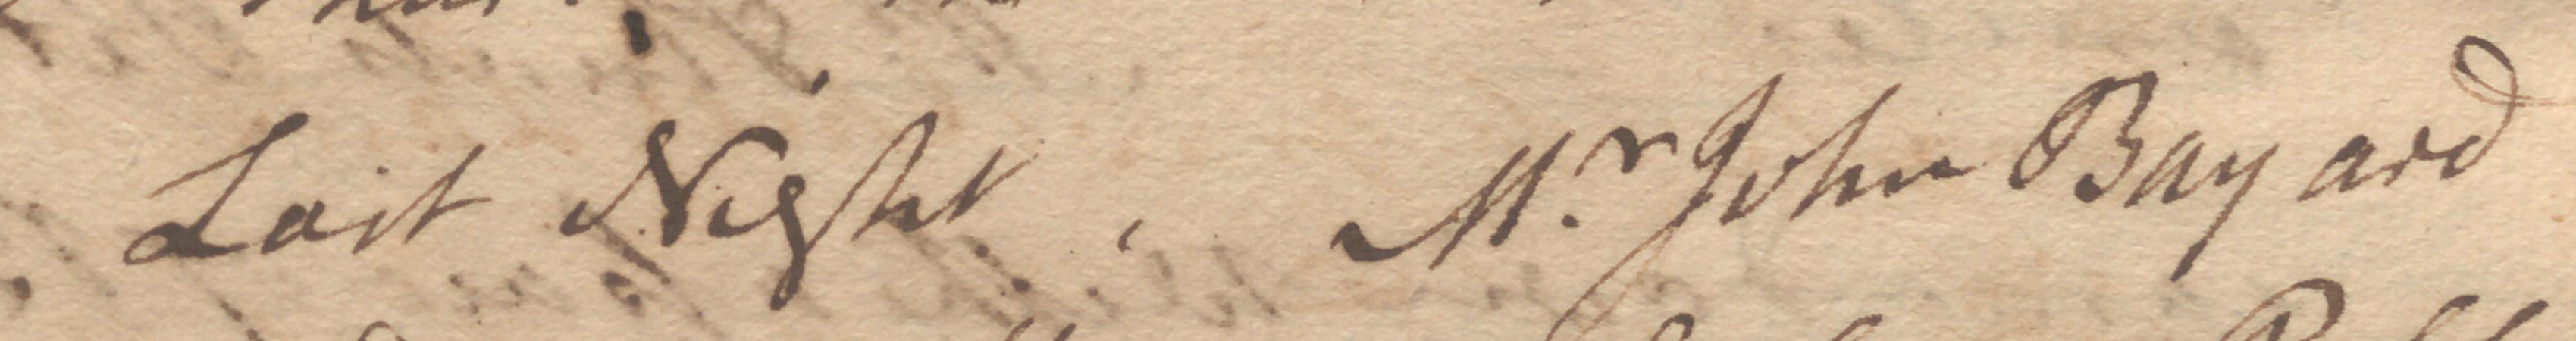Last Night, M^r. John Bayard
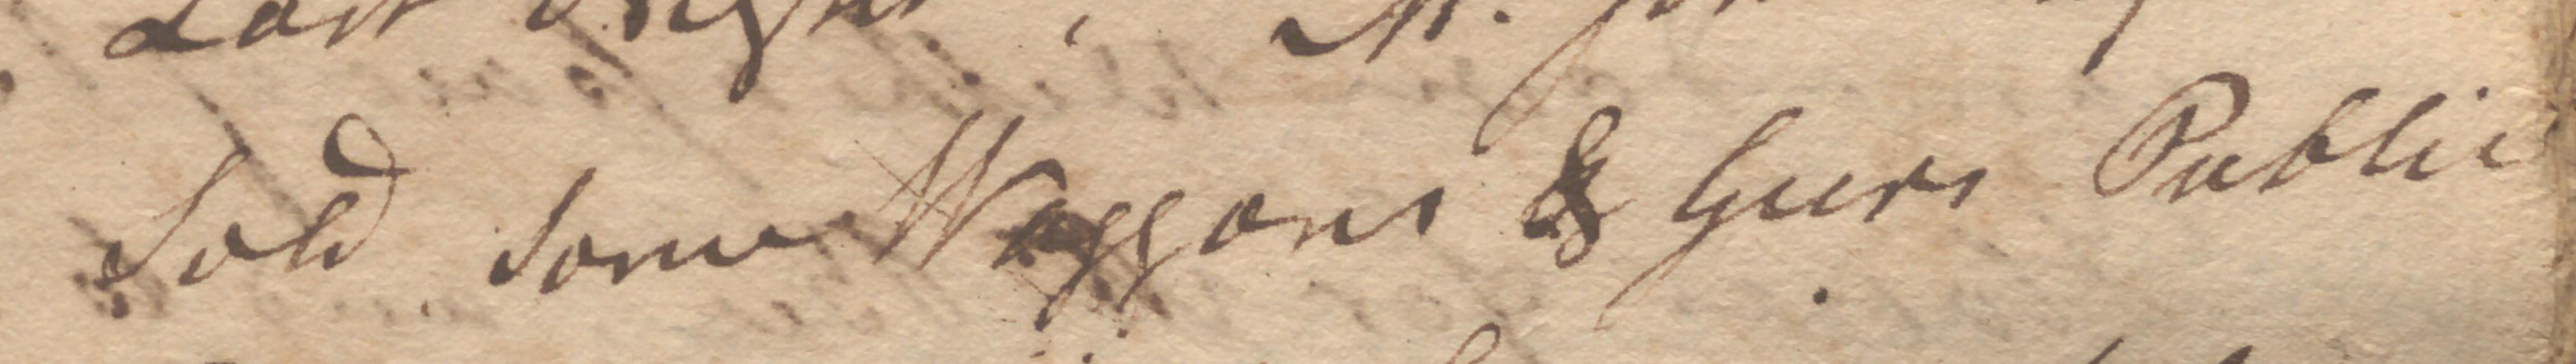sold some Waggons & Geers Public
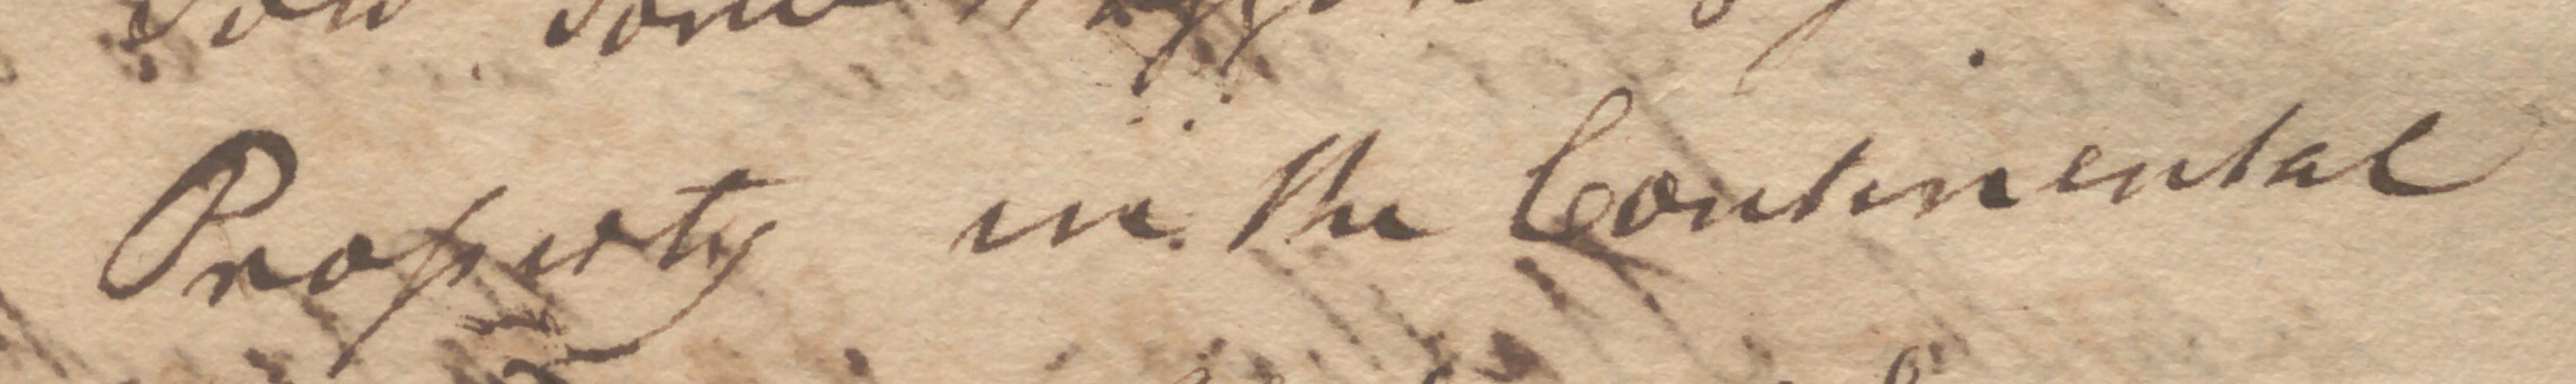Property in the Continental
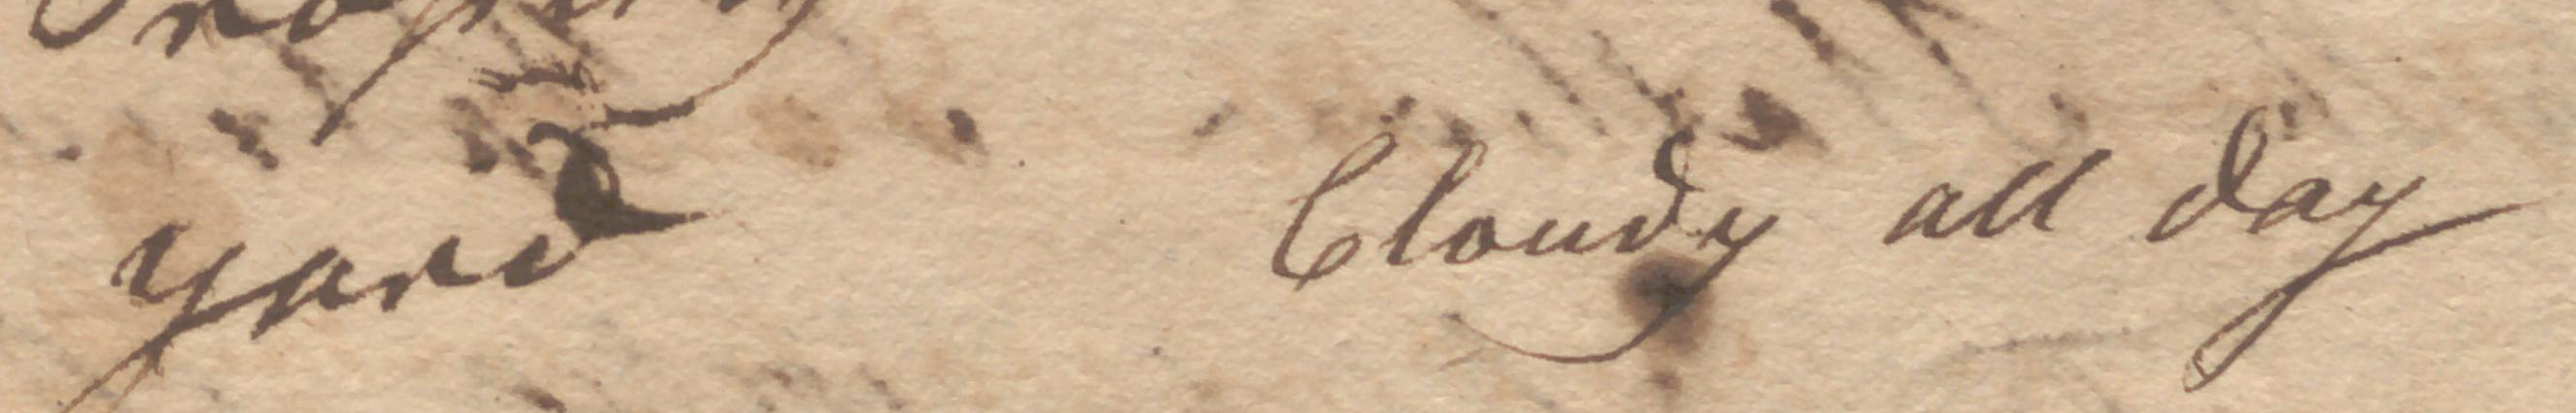yard Cloudy all day
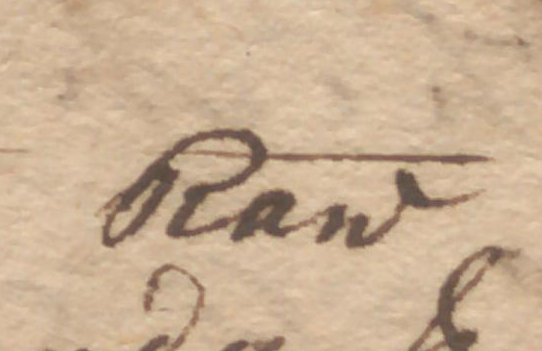Raw
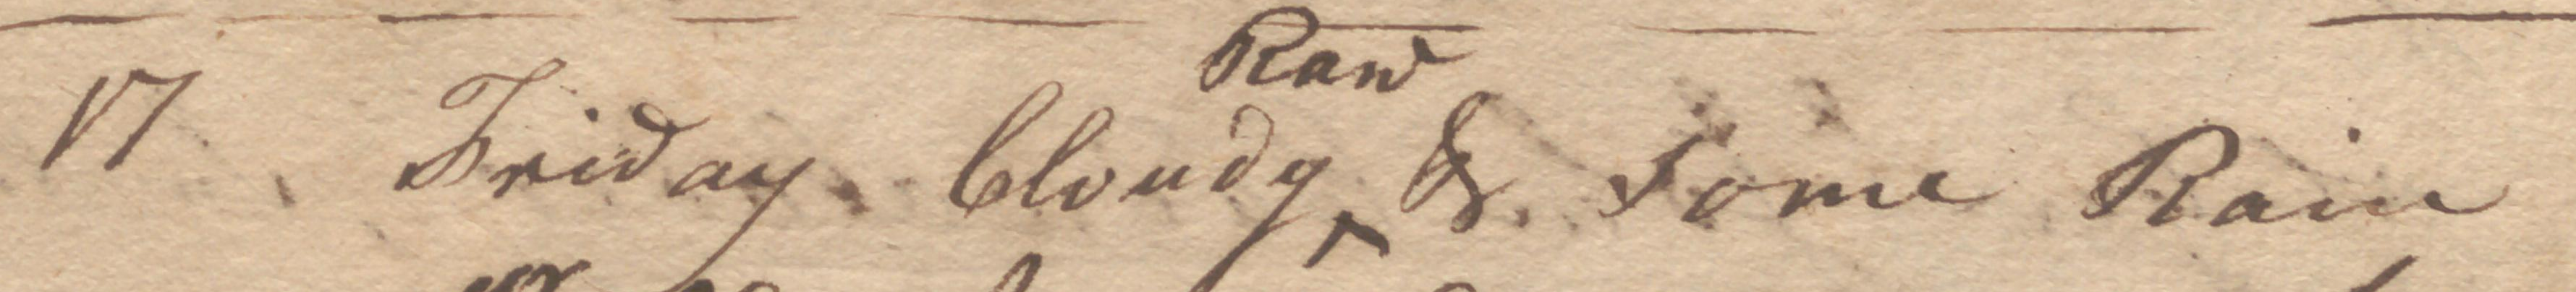17. Friday Cloudy ^ & some Rain
